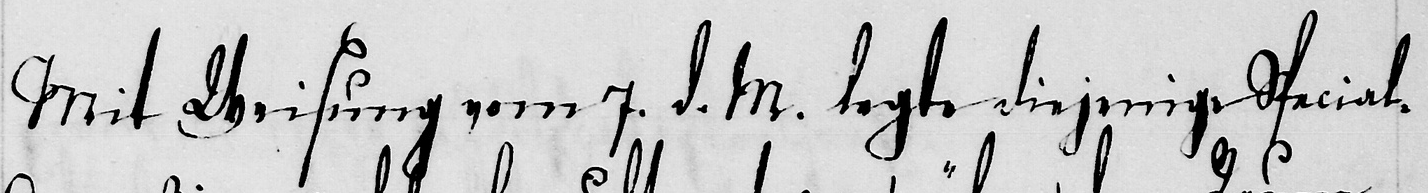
Mit Weisung vom 7. d. M. legte diejenige Specia¬
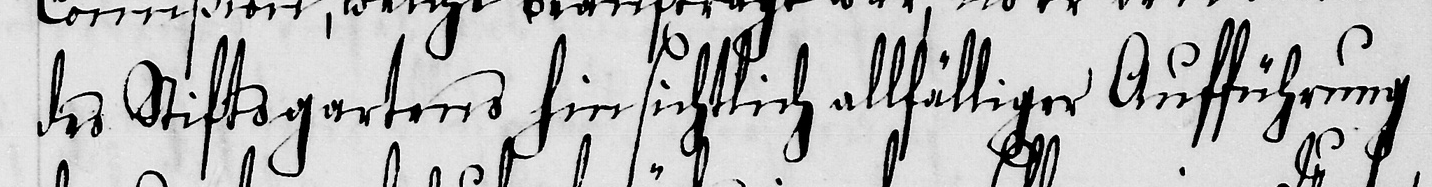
des Stiftsgartens hinsichtlich allfälliger Aufführung
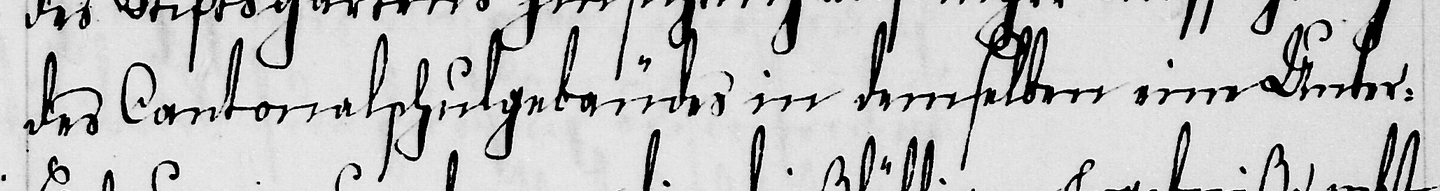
des Cantonalschulgebäudes in demselben eine Unter¬
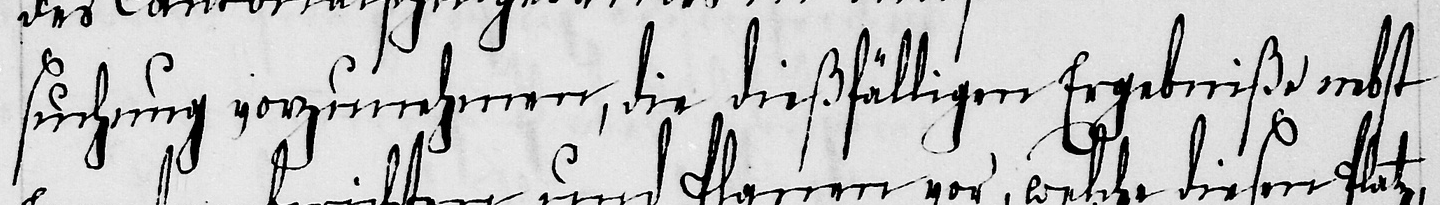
suchung vorzunehmen, die dießfälligen Ergebniße nebst
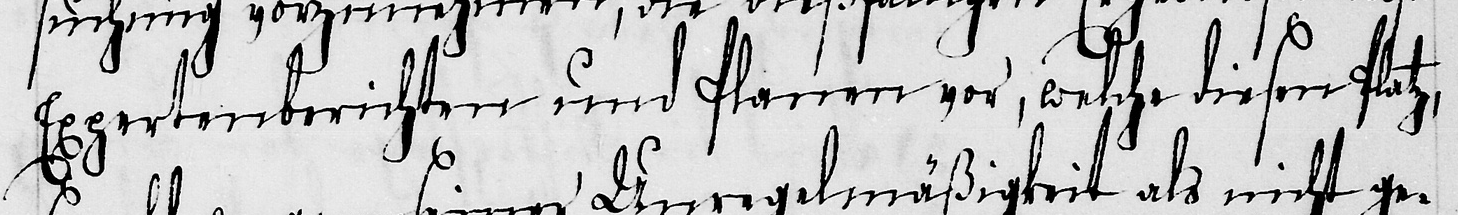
Expertenberichten und Planen vor, welche diesen Platz,
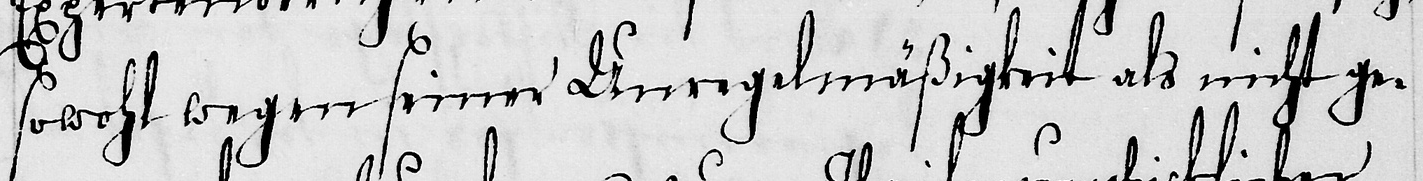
sowohl wegen seiner Unregelmäßigkeit als nicht ge¬
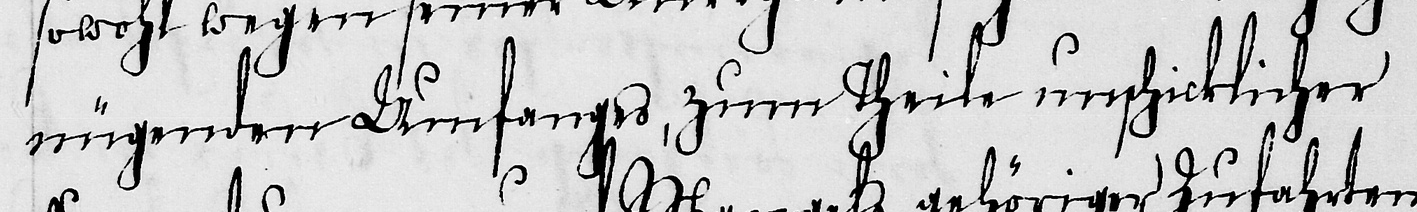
nügenden Umfanges, zum Theile unschicklicher
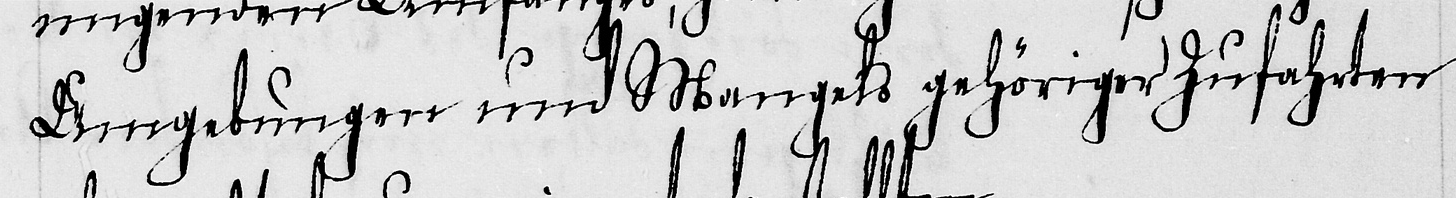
Umgebungen und Mangels gehöriger Zufahrten
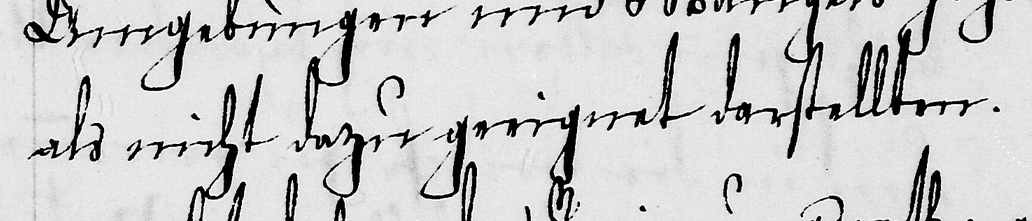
als nicht dazu geeignet darstellten.
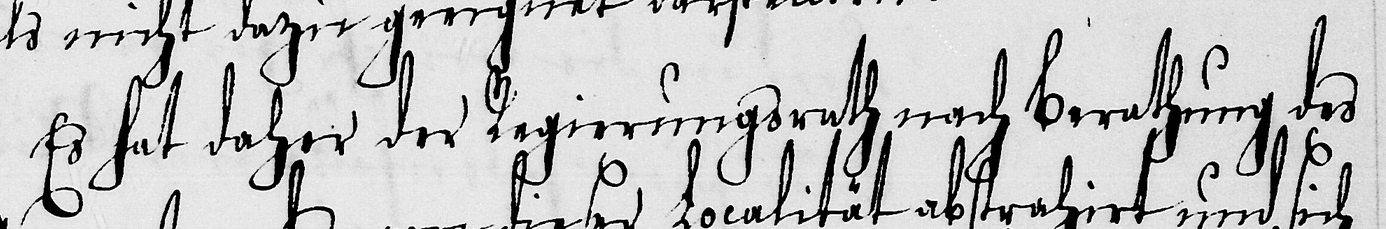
Es hat daher der Regierungsrath nach Berathung des
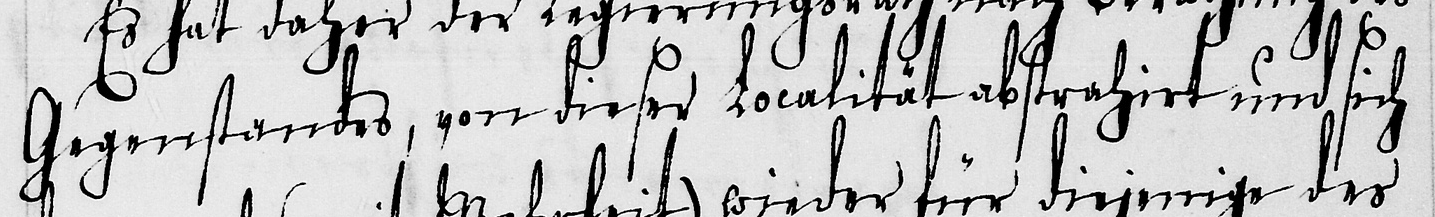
Gegenstandes, von dieser Localität abstrahirt und sich
